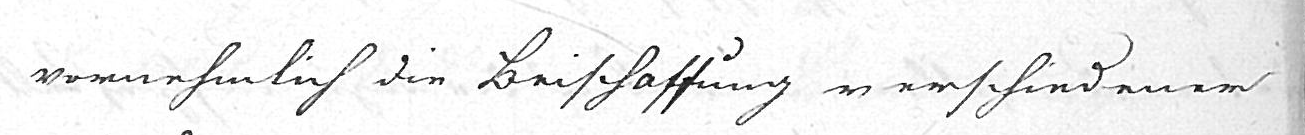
vornehmlich die Beischaffung verschiedener
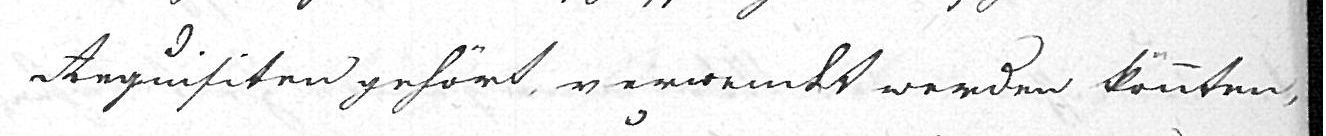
Requisiten gehört, verwendet werden könnten,
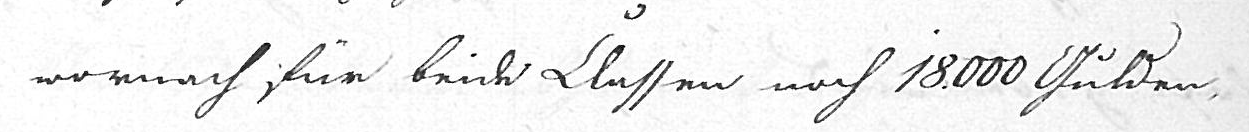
wornach für beide Classen noch 18.000 Gulden,
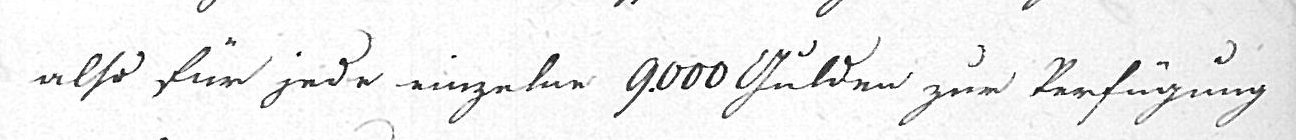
also für jede einzelne 9.000 Gulden zur Verfügung
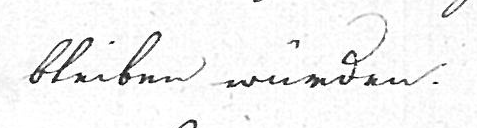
bleiben würden.
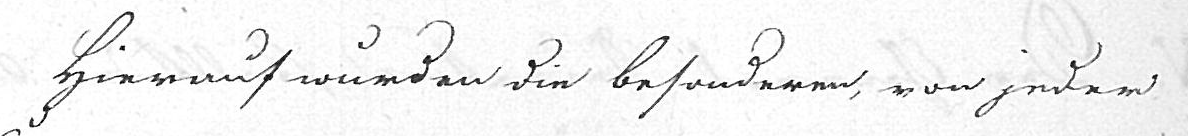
Hierauf wurden die besonderen, von jeder
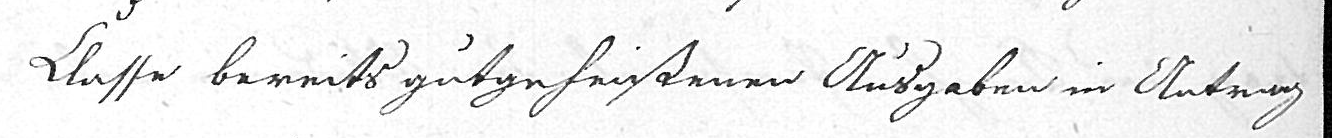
Classe bereits gutgeheißenen Ausgaben in Antrag
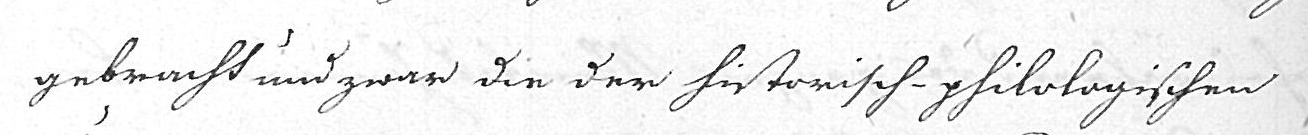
gebracht und zwar die der historisch-philologischen
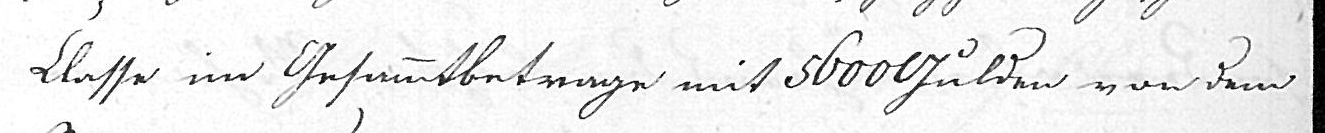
Classe im Gesammbetrage mit 5600 Gulden von dem
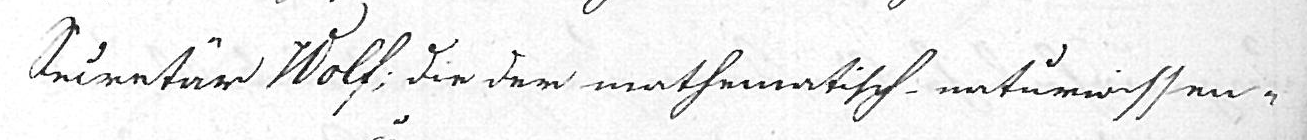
Secretär Wolf; die der mathematisch-naturwissen-
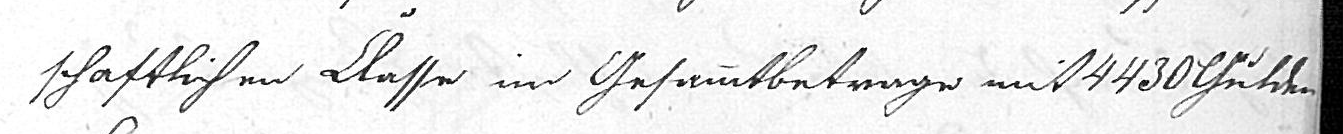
schaftlichen Classe im Gesammtbetrage mit 4430 Gulden
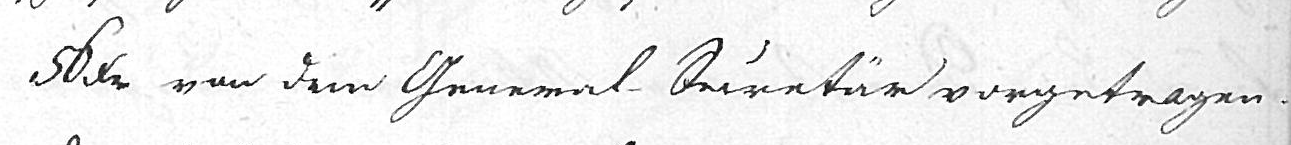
56 kr vorn dem General-Secretär vorgetragen.
